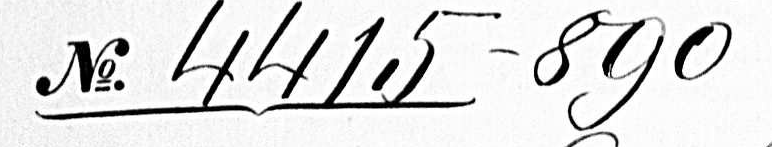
No. 4415 - 890
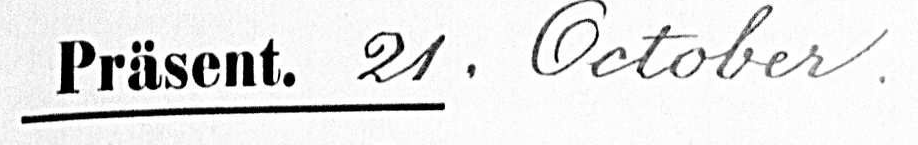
Präsent. 21. October.
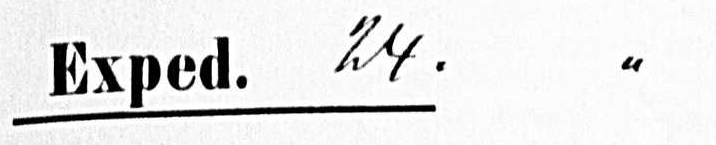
Exped. 24. October.
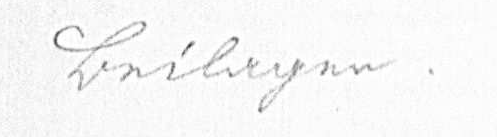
Beilagen.
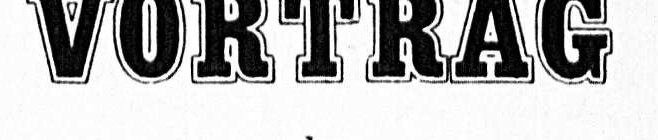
Vortrag
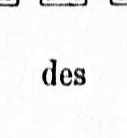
des
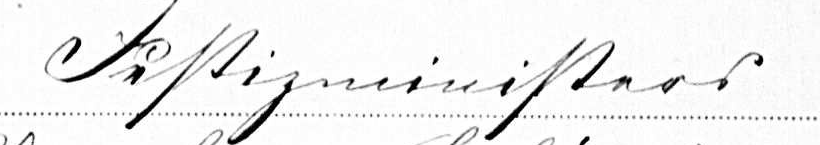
Justizministers
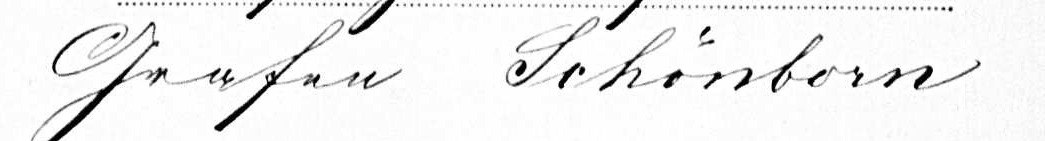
Grafen Schönborn
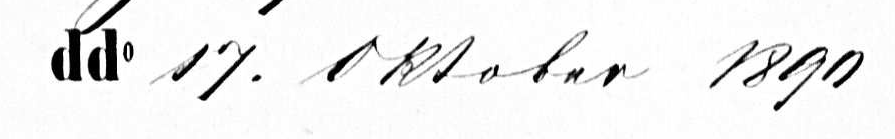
ddo 17. Oktober 1890
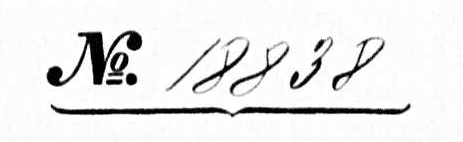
No. 18838
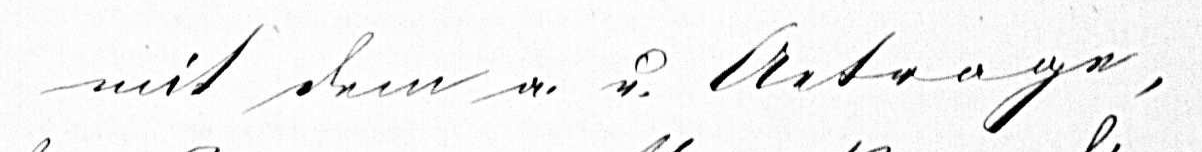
mit dem a. u. Antrage,
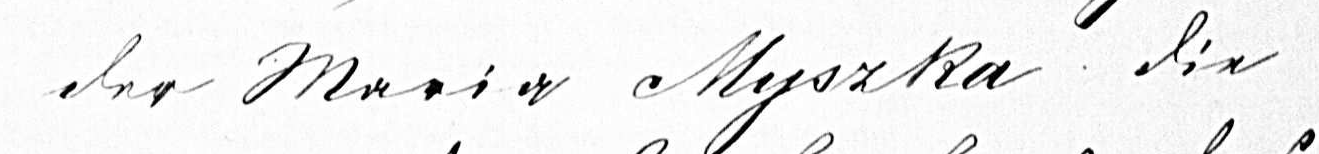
der Maria Myszka die
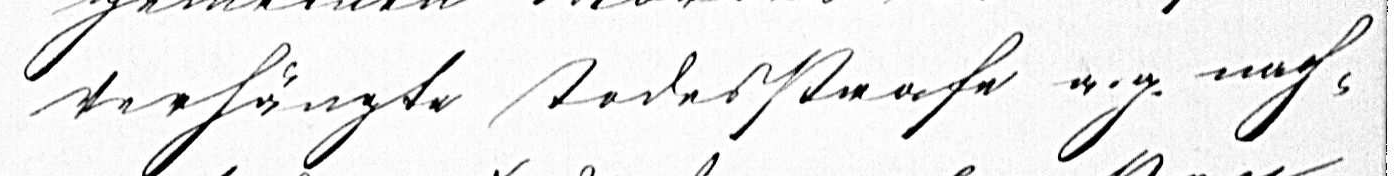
verhängte Todesstrafe a. g. nach¬
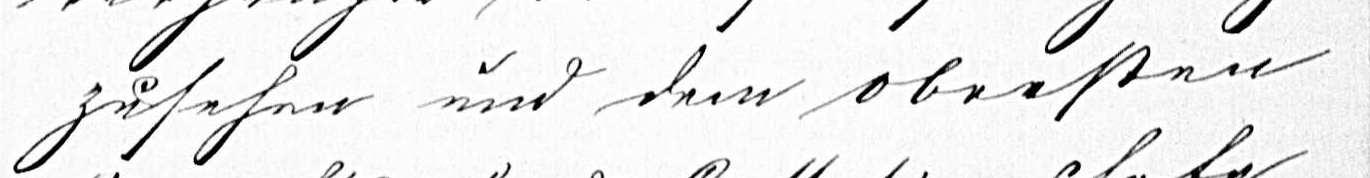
zusehen und dem obersten
